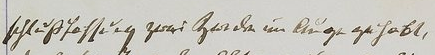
schlußfassung zwei Zwecke im Auge gehabt,
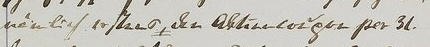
nämlich erstens den Aktiencoupon per 31.
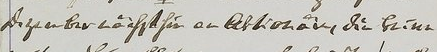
Dezember nächsthin an Aktionäre, die keine
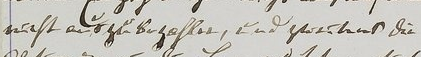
nicht auszubezahlen, und zweitens die
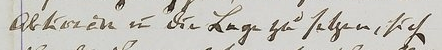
Aktionäre in die Lage zu setzen, sich
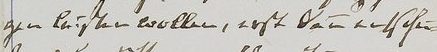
gen leisten wollen, erst dann entschei-
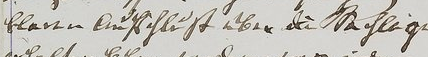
klaren Aufschluß über die Sachlage
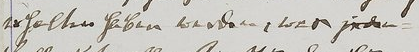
erhalten haben werden, was jeden-
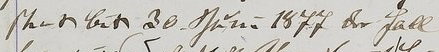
stens bis 30. Juni 1877 der Fall
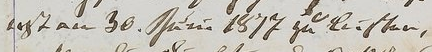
erst am 30. Juni 1877 zu leisten,
